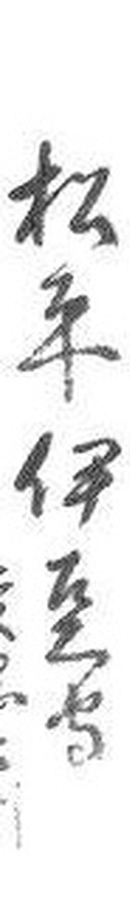松平伊豆守
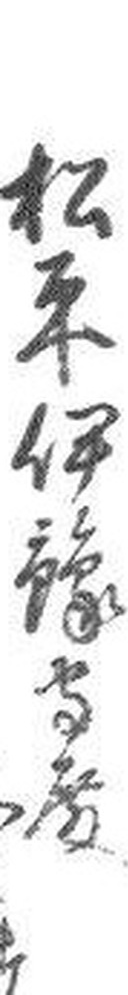松平伊豫守殿
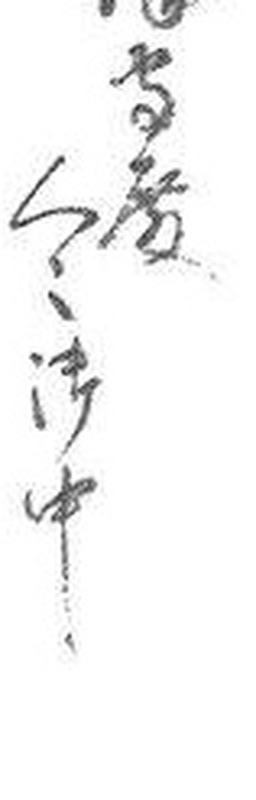人々御中
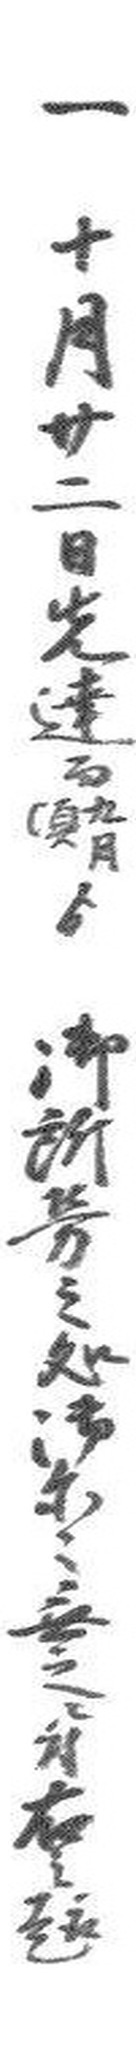一十月廿二日先達而九月頃ゟ御所労之処御尓々無之ニ付右之趣
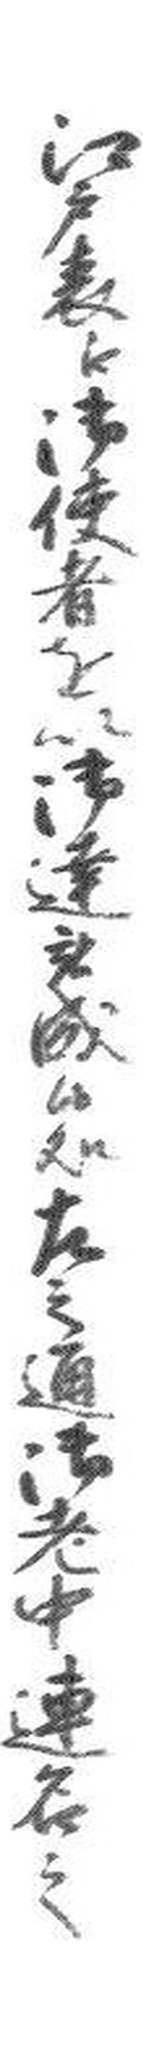江戸表江御使者を以御達被成候処左之通御老中連名之
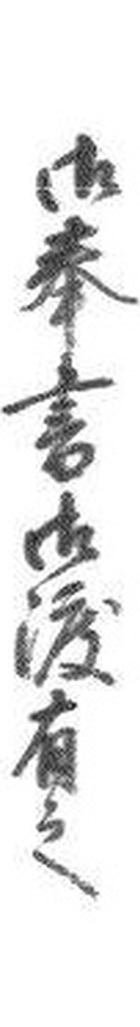御奉書御渡有之
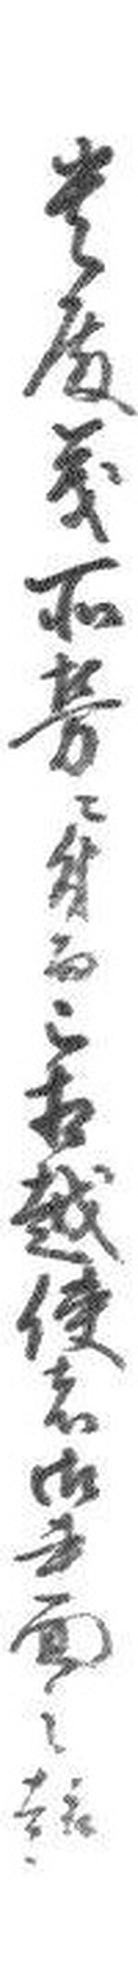貴殿義所労ニ付而被相越使者御書面之趣
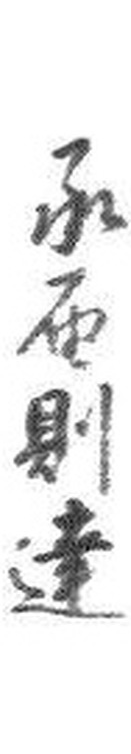承届則達
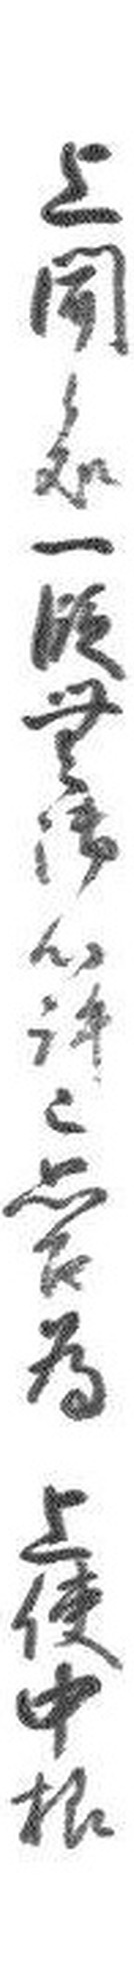上聞候処一段無御心許被思召為上使中根
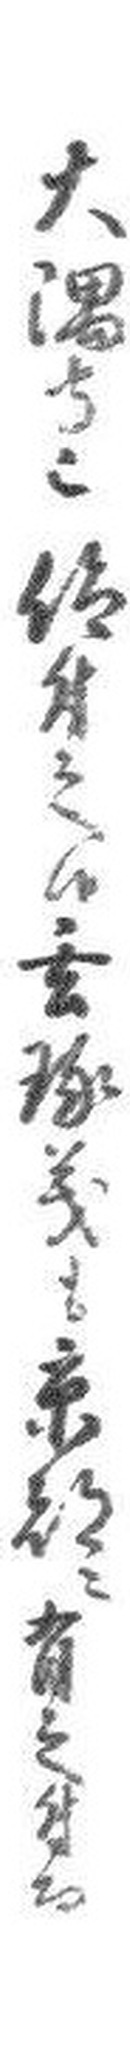大隅守被仰付之候玄琢義も京都ニ有之付而
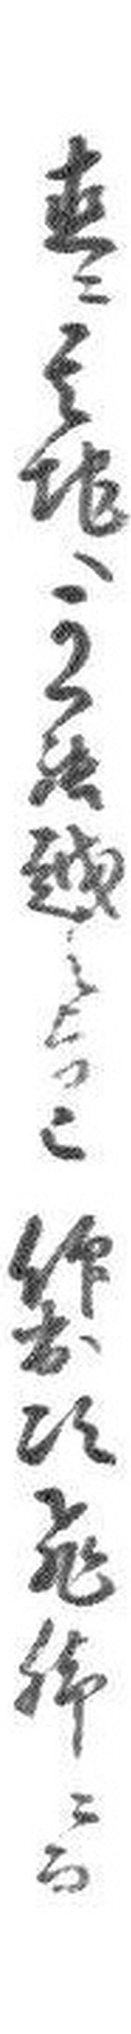直ニ其地へ可罷越之旨被仰出次飛脚ニ而

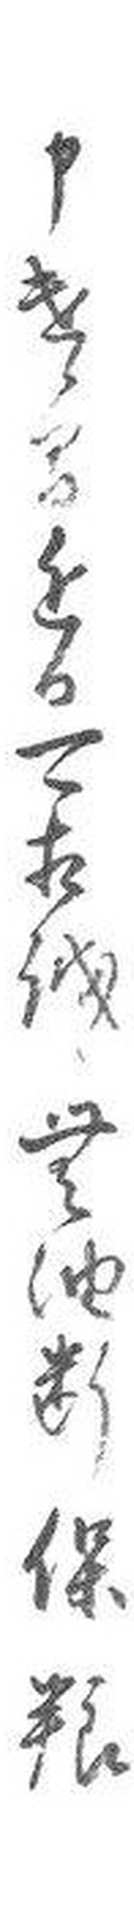申遣候間近日可相越候無油断保養
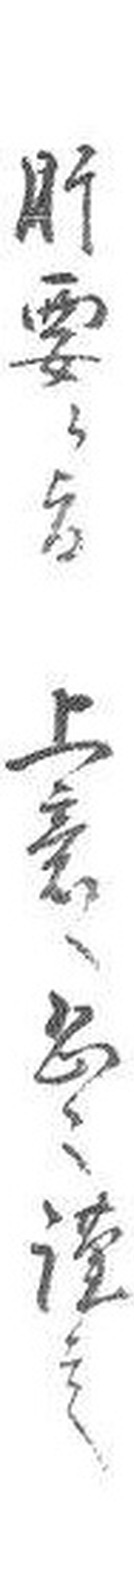肝要候旨上意候恐々謹言
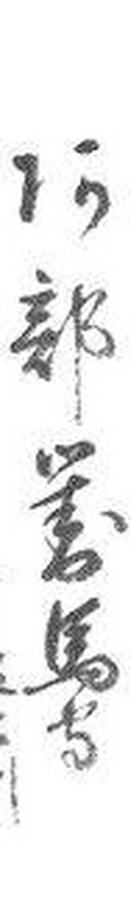阿部対馬守
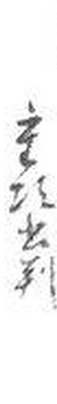重次書判
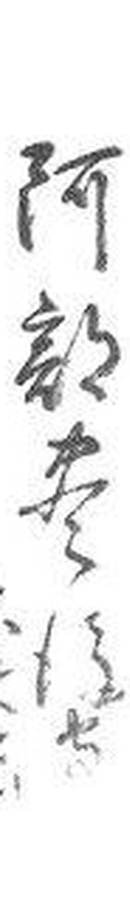阿部豊後守
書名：家譜 四 忠昌公 従寛永七年到正保四年
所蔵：福井県文書館 Fukui Prefectural Archives
